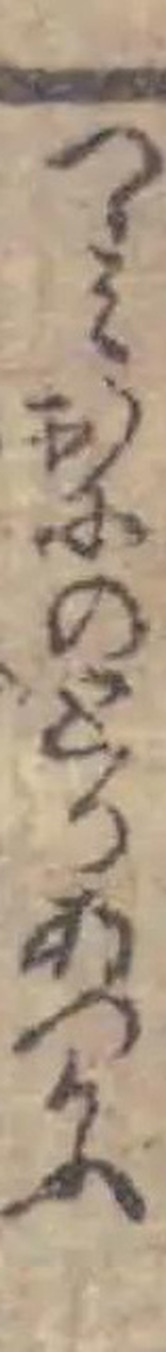つゝみおにのとりあつかふ
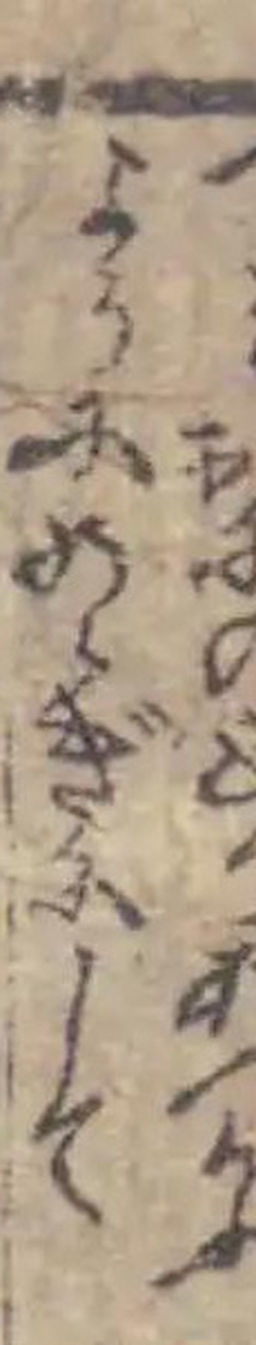ようにめくぎにして
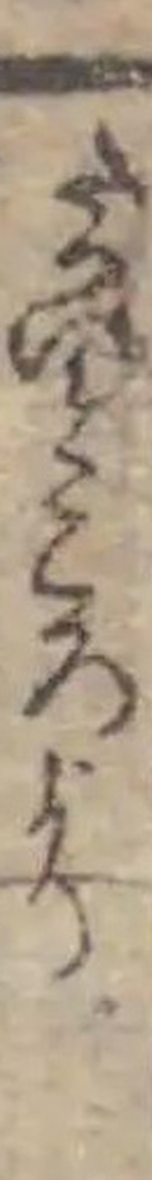たかいところより
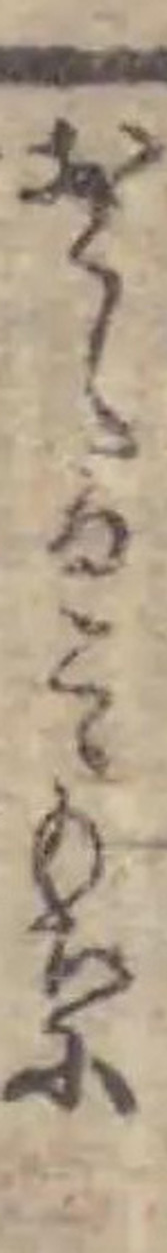おとしたるこゝもちに
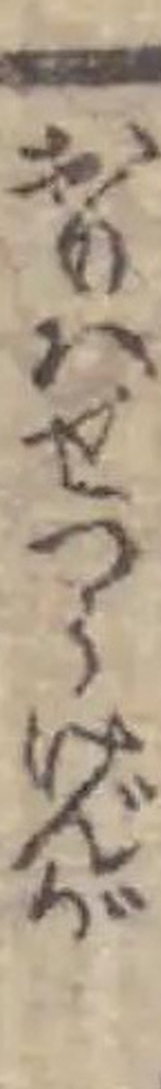おもはせつうげんが
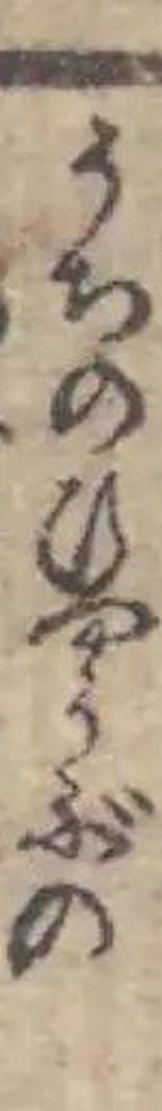うちのひやうぶの
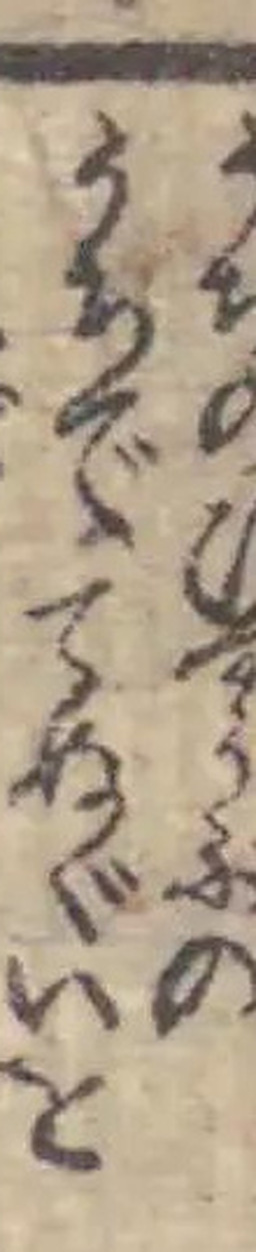うちでてぬぐいを
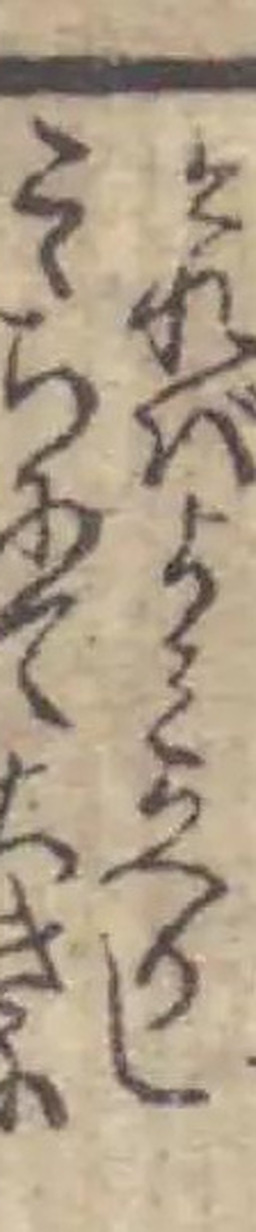こゝちにて大きに
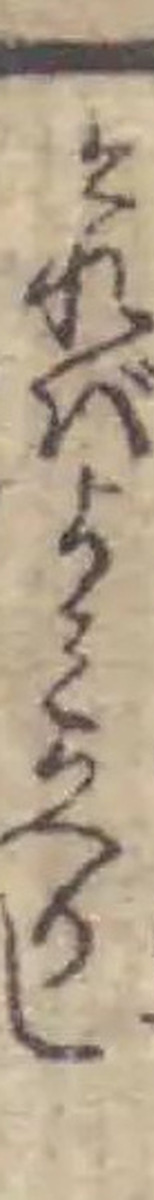とればよみかへりし
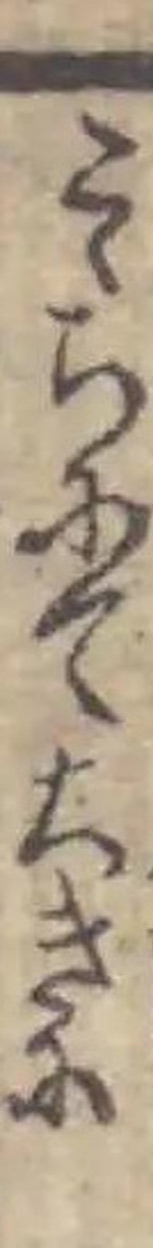こゝちにて大きに
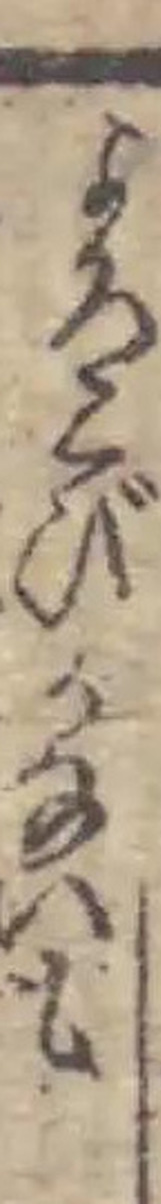よろこびかないも
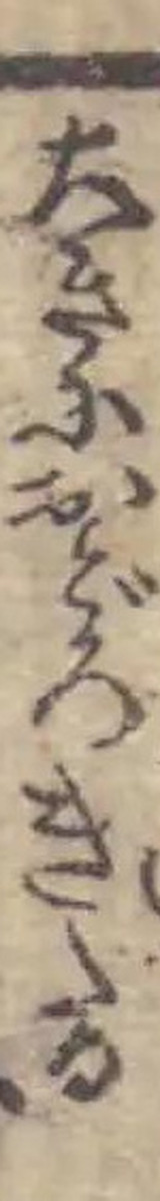大きにおどろきたる
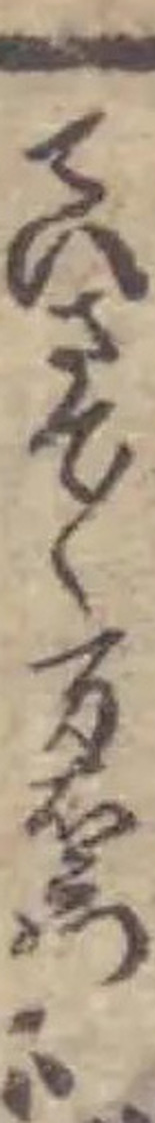ていさて〳〵万右衛門
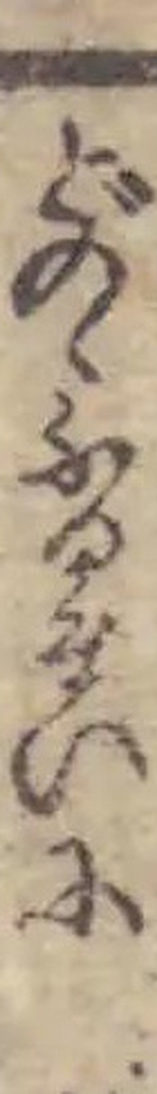どのゝふるまいに
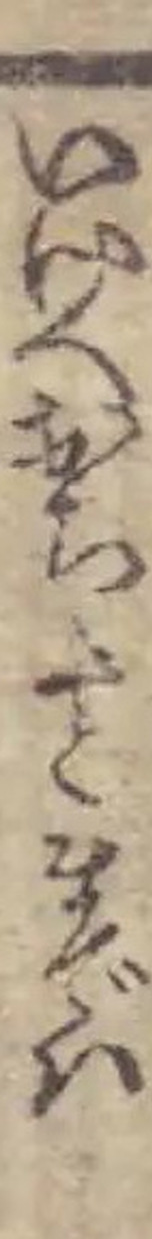いけへおちたことまでは
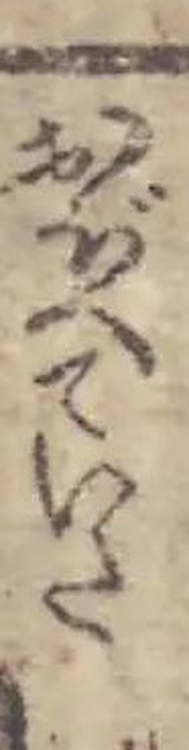おぼへていた
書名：飲中八人前 3巻
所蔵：国立国会図書館 National Diet Library, JAPAN
